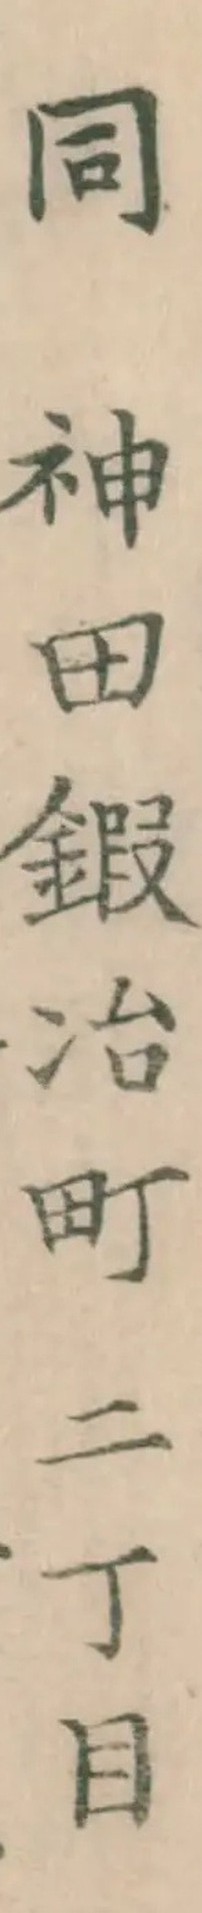同神田鍛冶町二丁目
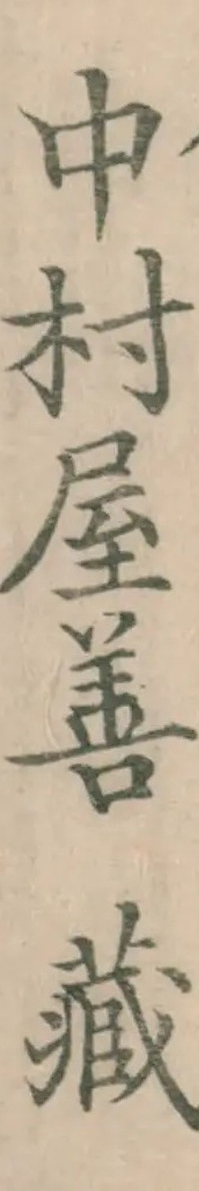中村屋善藏

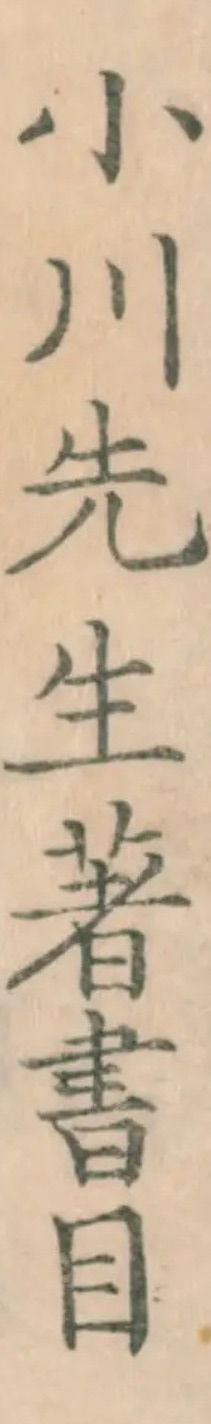小川先生著書目
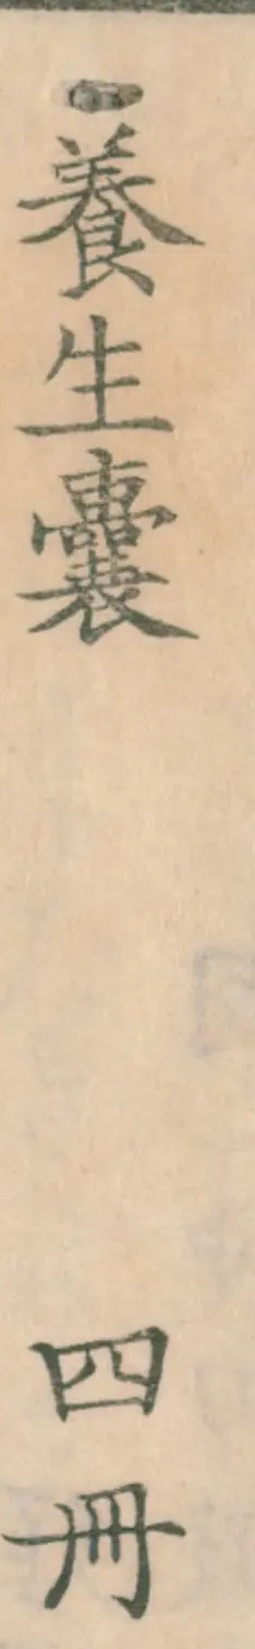養生囊四冊
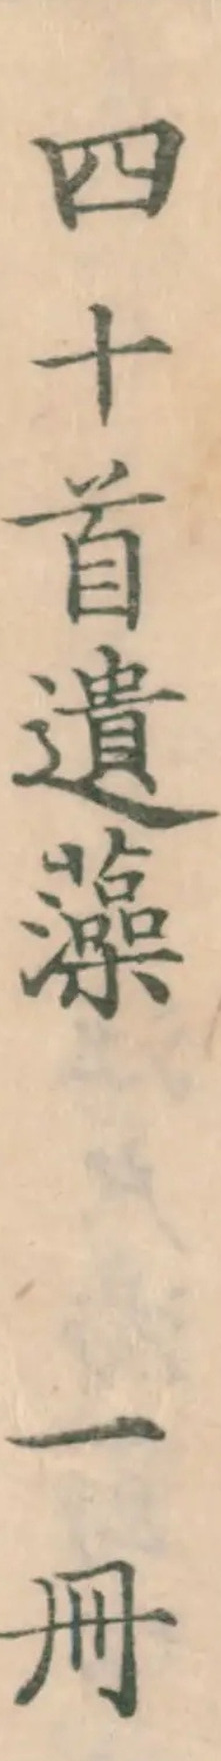四十首遺藻一冊
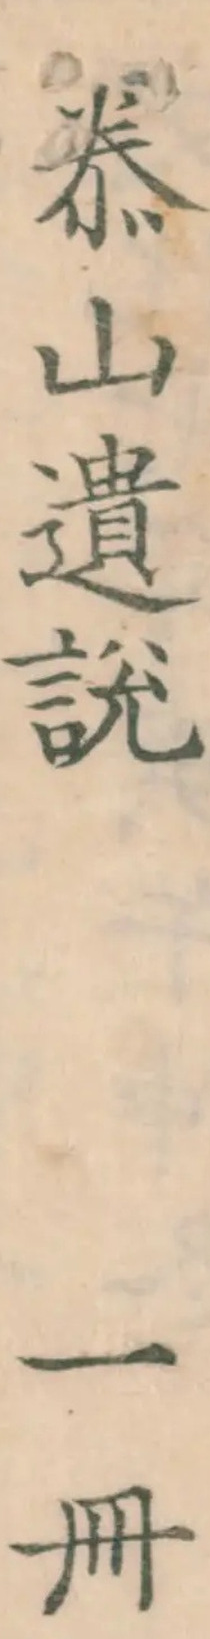泰山遺説一冊
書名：瘡家示訓
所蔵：国立国会図書館 National Diet Library, JAPAN
